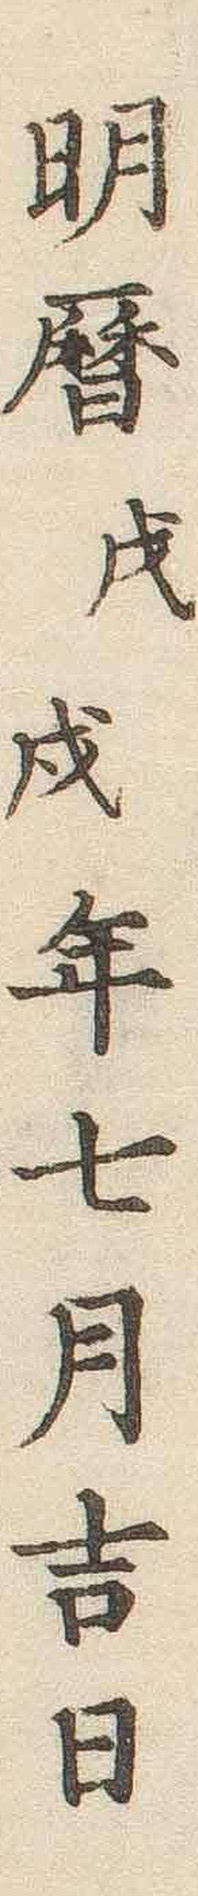明歷戊戌年七月吉日
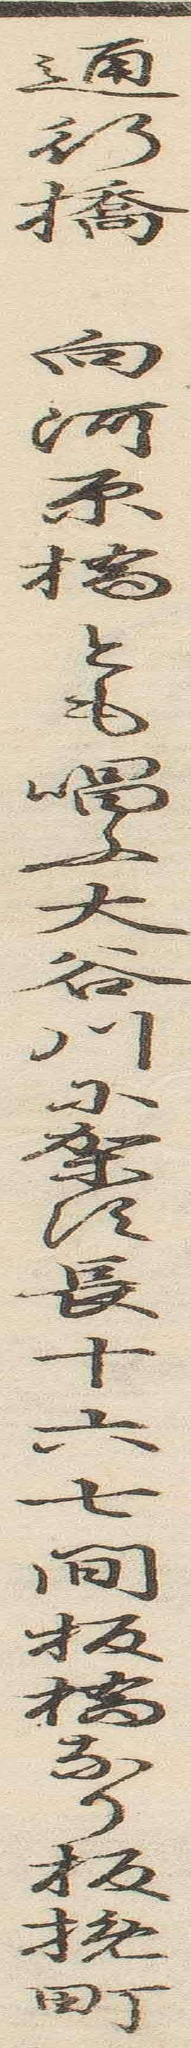通行橋向河原橋とも唱ふ大谷川に架す長十六七間板橋なり板挽町
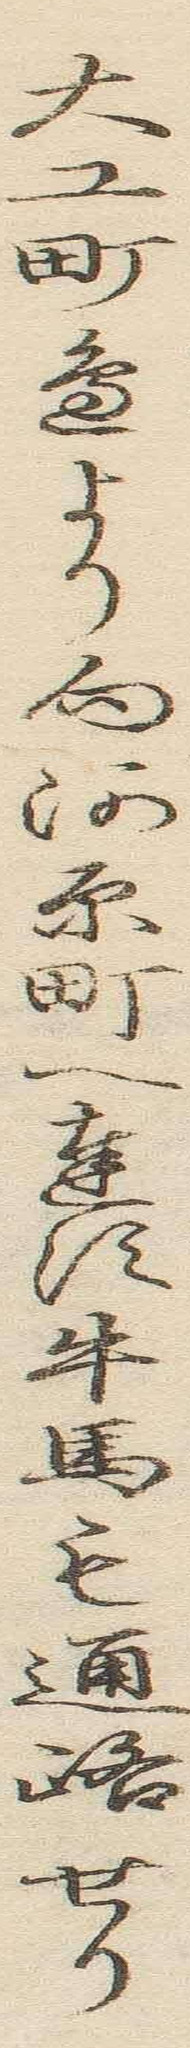大工町邊より向河原町へ達す牛馬も通路せり
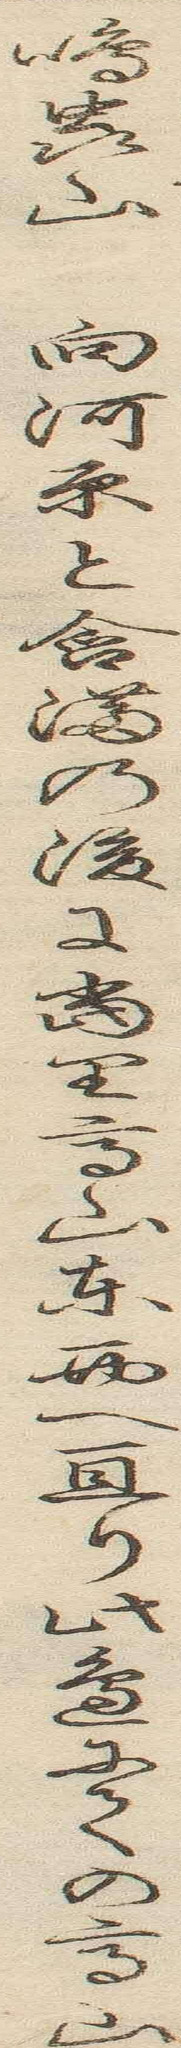鳴蟲山向河原と含満の後に當り高山東西へ亘り此邊にての高山
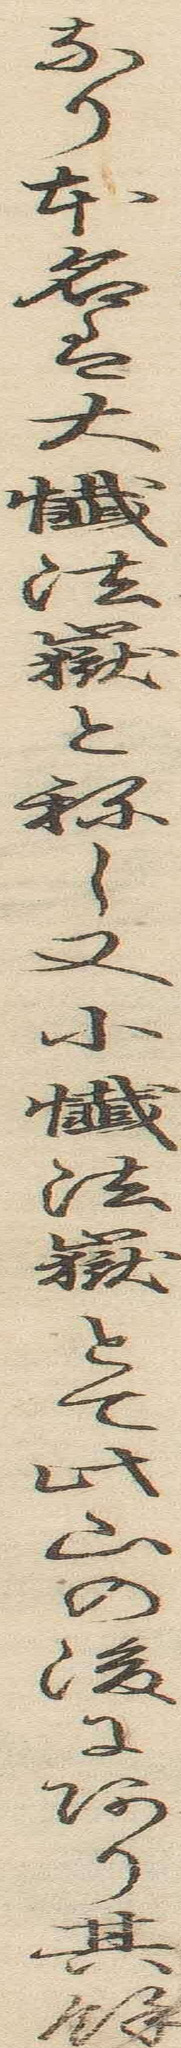なり本名は大懴法嶽と称し又小懴法嶽とて此山の後にあり其餘

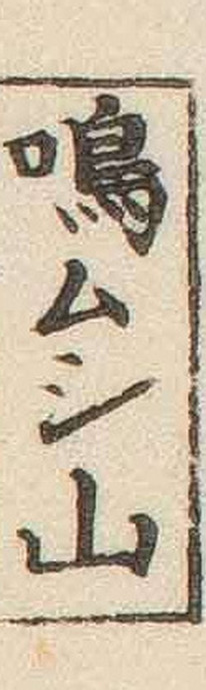鳴ムシ山
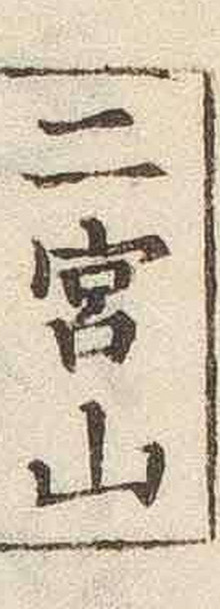二宮山
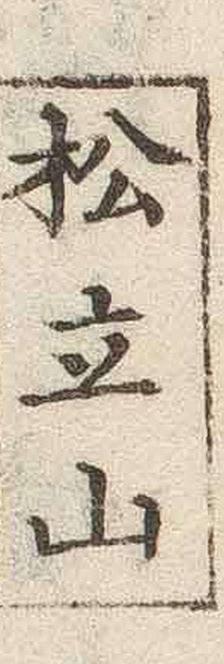松立山
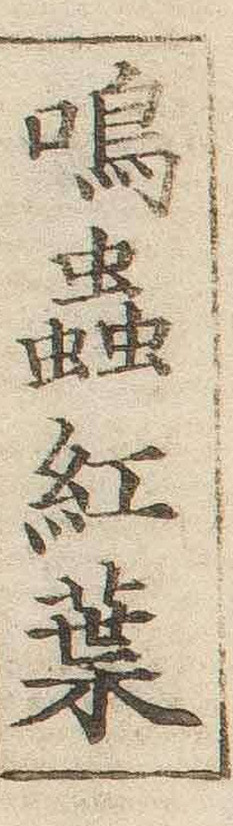鳴蟲紅葉

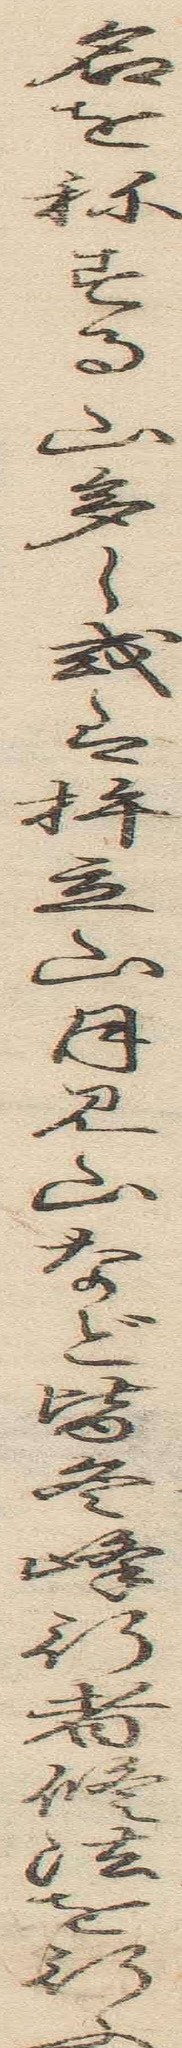名を称する山多し或は杵立山月見山など皆冬峰行者修法を行ふ
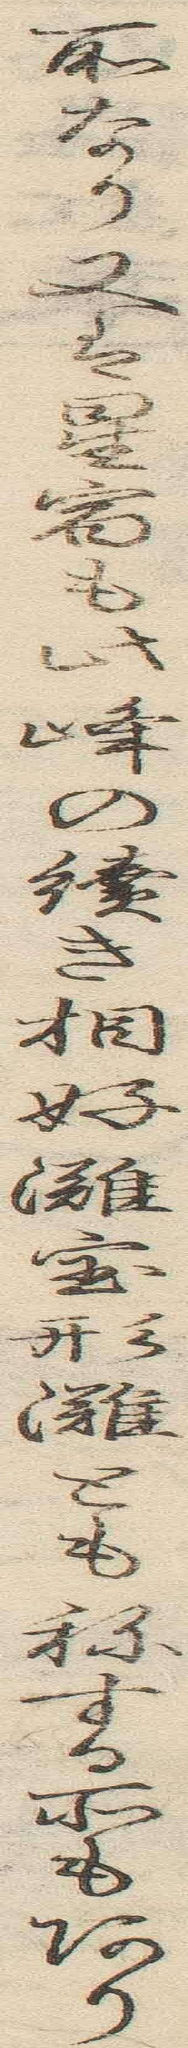所なり又は星宿も此峰の續き相好灘宝形灘とも称する所もあり
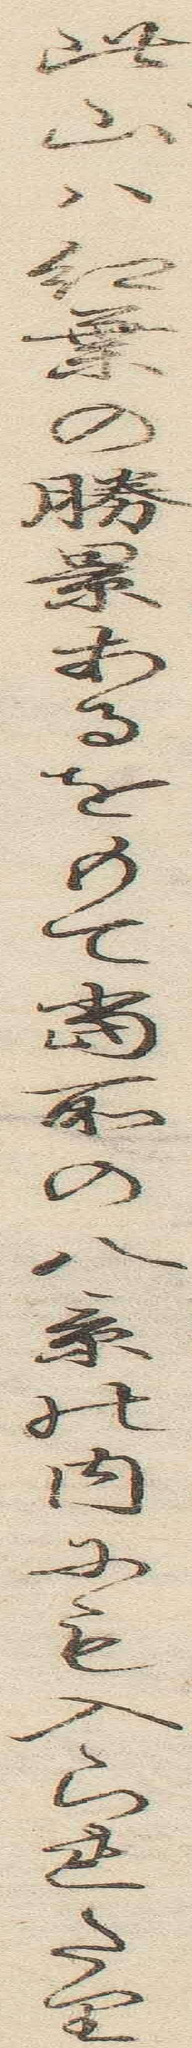此山は紅葉の勝景あるをもて當所の八景の内にも入られたり
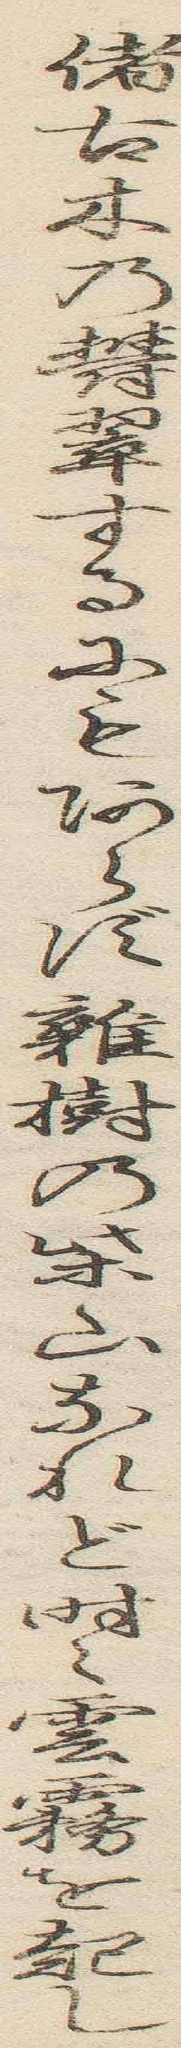偖古木の欝翠するにもあらず雜樹の柴山なれど时〻雲霧を起し
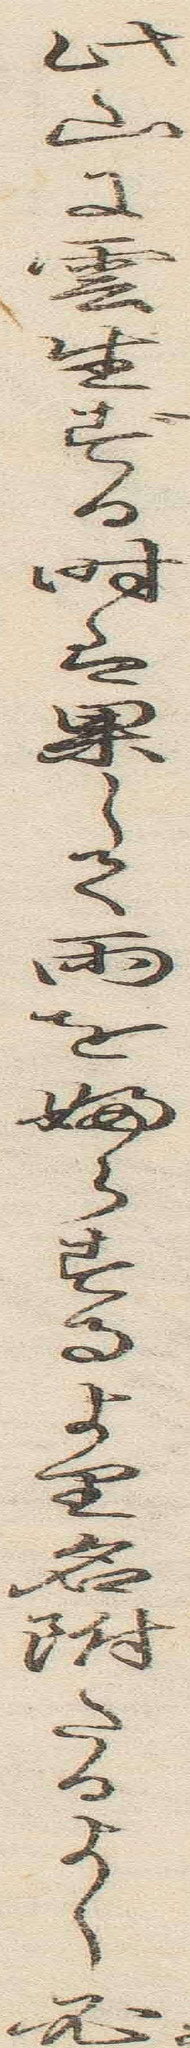此山に雲生ずる时は果して雨をふらするより名附たるよし必
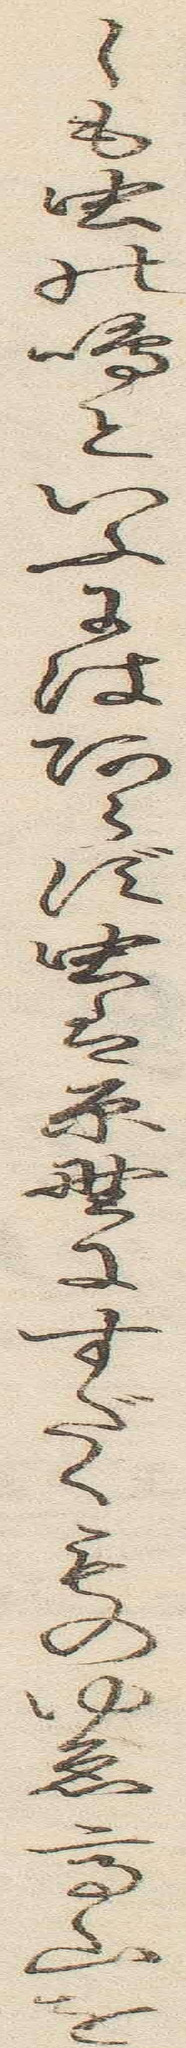しも虫の鳴といふにはあらず虫は原㙒にすだくものゆゑ高山を
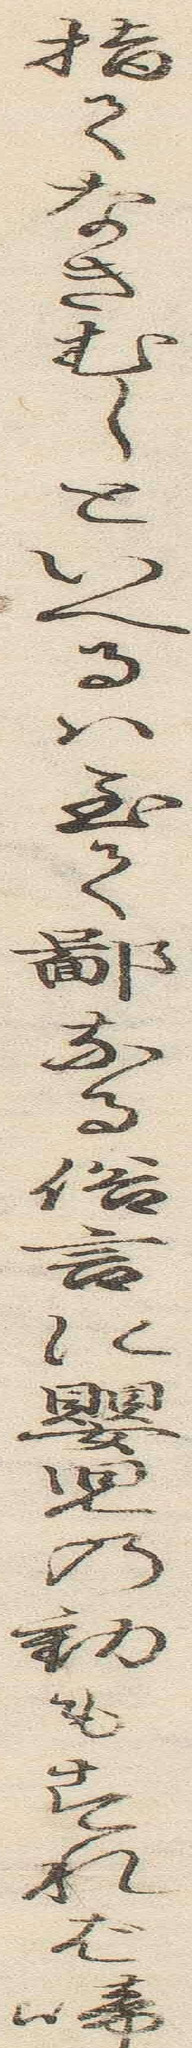指てなきむしといへるは至て鄙なる俗言に嬰児の動もすれば啼
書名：日光山志
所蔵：東京学芸大学附属図書館 国文学研究資料館
